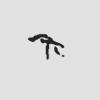下
